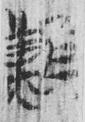難
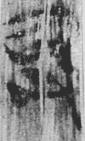𠭁
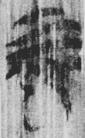而
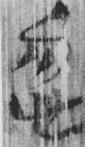愓（易）
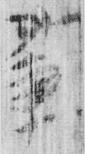{外車}（外）
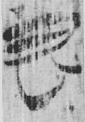母
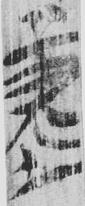堇（謹）
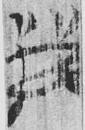弗
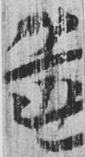志
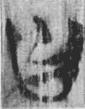曰
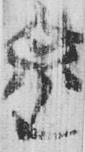余
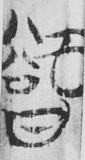知
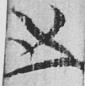之
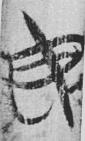母
